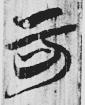可
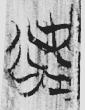欲
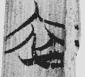衣
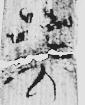而
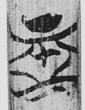亞（惡）
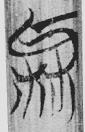○（枲）
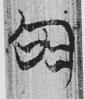含（今）
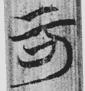可
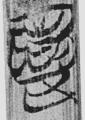婁（鶹）
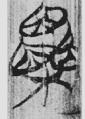○（鷅）
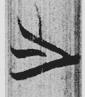之
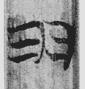羽
